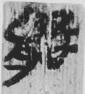能
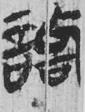詞（治）
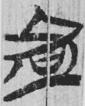者
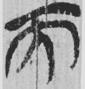而
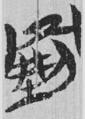○（刑）
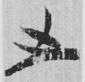之
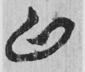㠯（以）
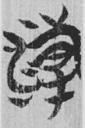○（旱）
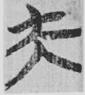夫
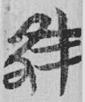唯（雖）
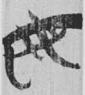母（毋）
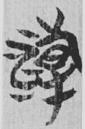○（旱）
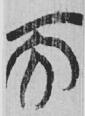而
